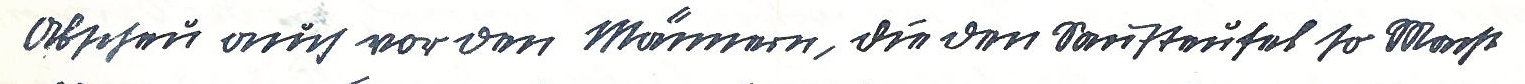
Abscheu auch vor den Männern, die den Saufteufel so Macht
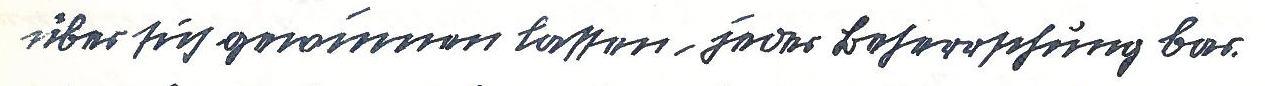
über sich gewinnen lassen, jeder Beherrschung bar.
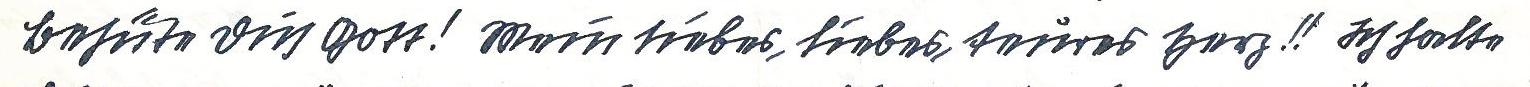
Behüte Dich Gott! Mein liebes, liebes teures Herz!! Ich halte
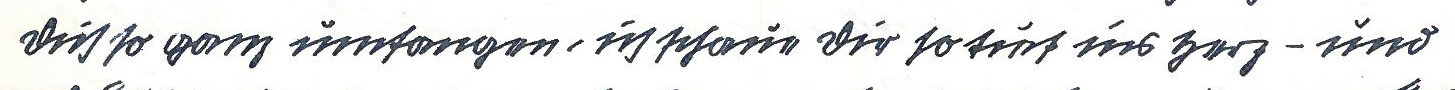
Dich so ganz umfangen, ich schaue Dir so tief ins Herz – und
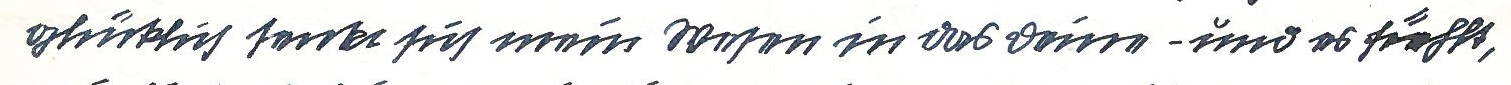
glücklich senke ich mein Wesen in das Deine – und es fühlt,
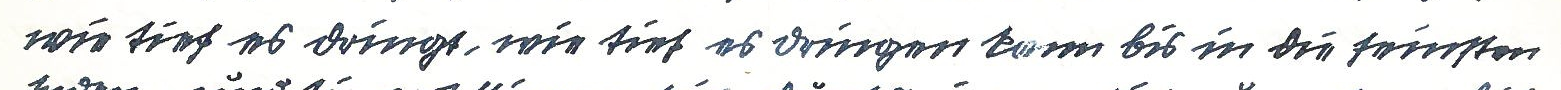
wie tief es dringt, wie tief es dringen kann bis in die feinsten
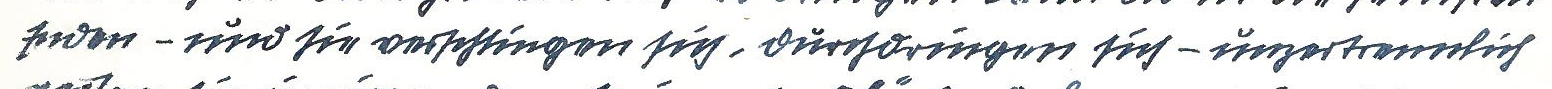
Enden – und sie verschlingen sich, durchdringen sich – unzertrennlich
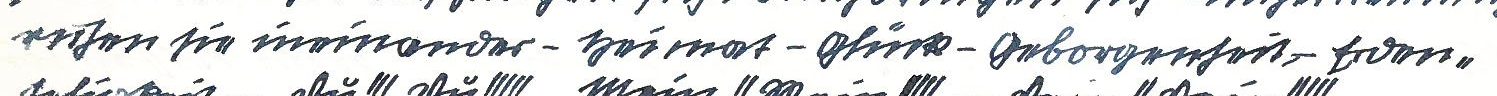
ruhen sie ineinander – Heimat – Glück – Geborgenheit, – Erden¬
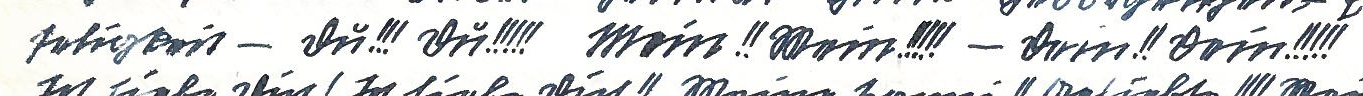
seligkeit – Du!!! Du!!!!! Mein!! Mein!!!!! – Dein!! Dein!!!!!
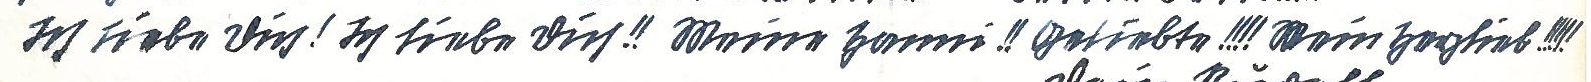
Ich liebe Dich! Ich liebe Dich!! Meine !! Geliebte!!!! Mein Herzlieb!!!!.
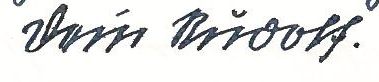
Dein.
